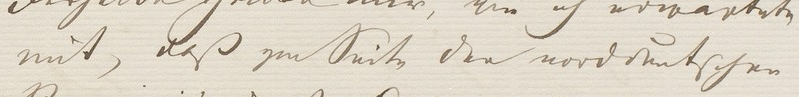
mit, daß von Seite der norddeutschen
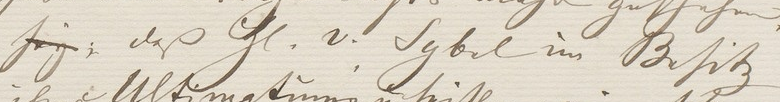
sey; daß H. v. Sybel im Besitz
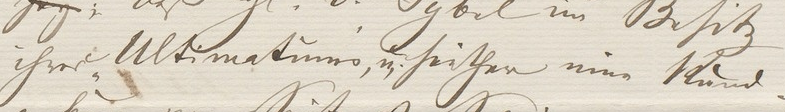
ihres Ultimatum's, u. seither eine Kund-
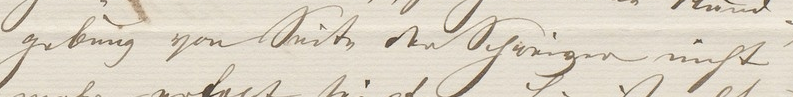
gebung von Seite der Schweizer nicht
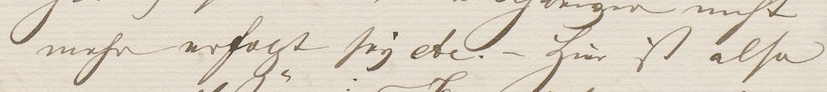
mehr erfolgt sey etc. – Hier ist also
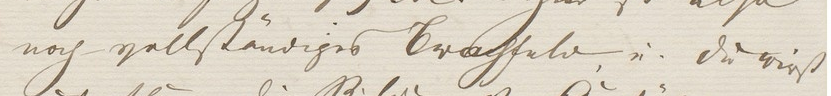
noch vollständiges Brachfeld, u. du wirst
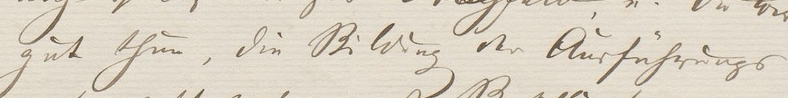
gut thun, die Bildung der Ausführungs-
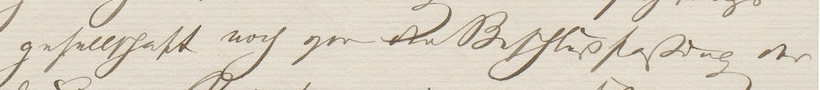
gesellschaft noch vor der Beschlußfaßung des
